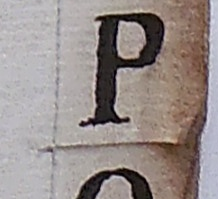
P
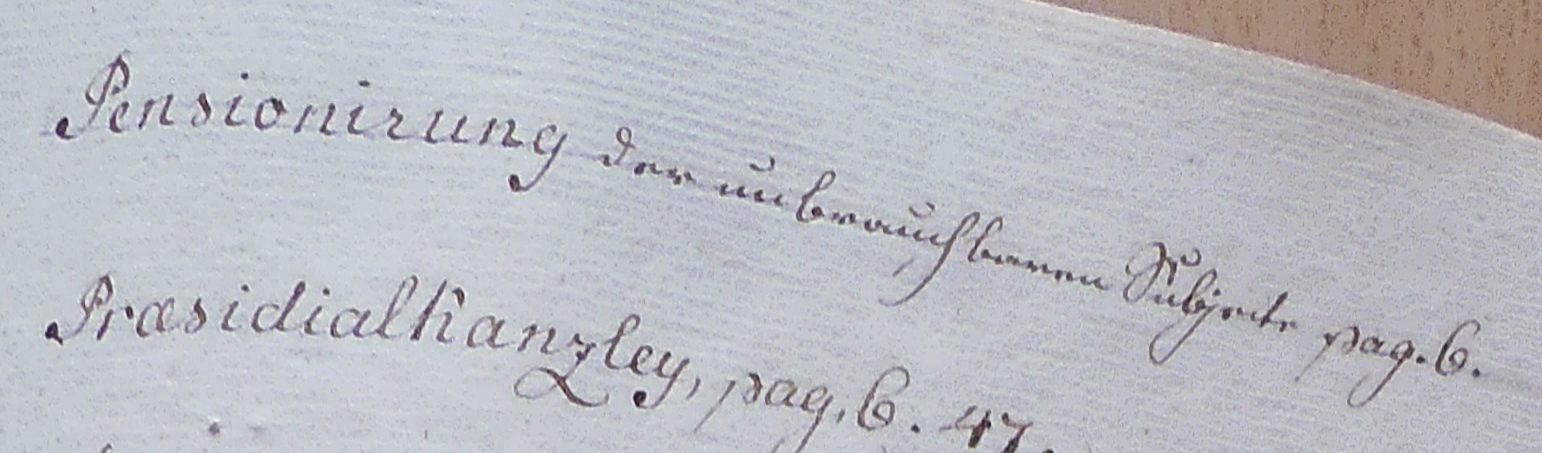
Pensionirung der unbrauchbaren Subjecte pag. 6.
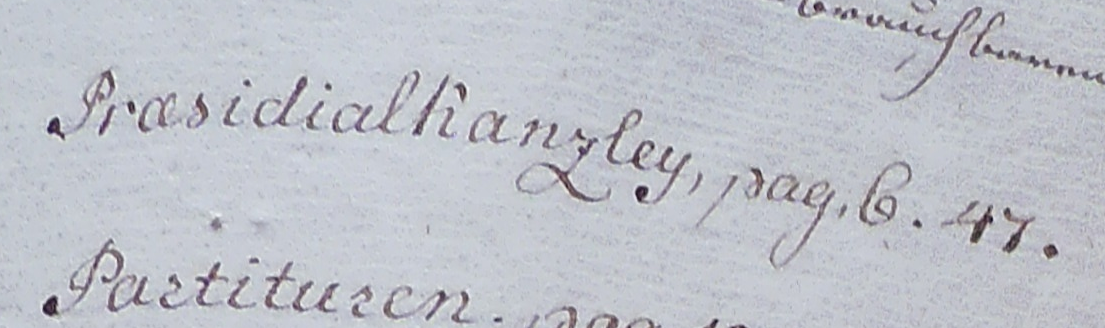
Præsidialkanzley, pag. 6. 47.
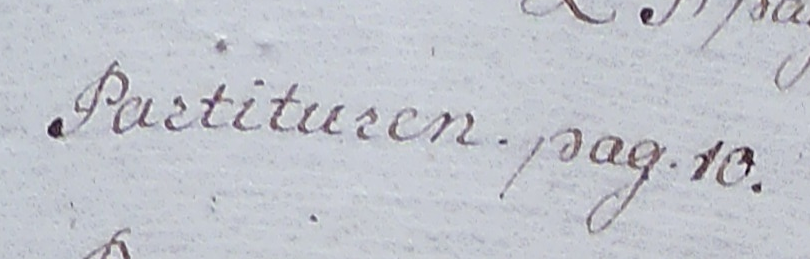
Partituren. pag. 10.
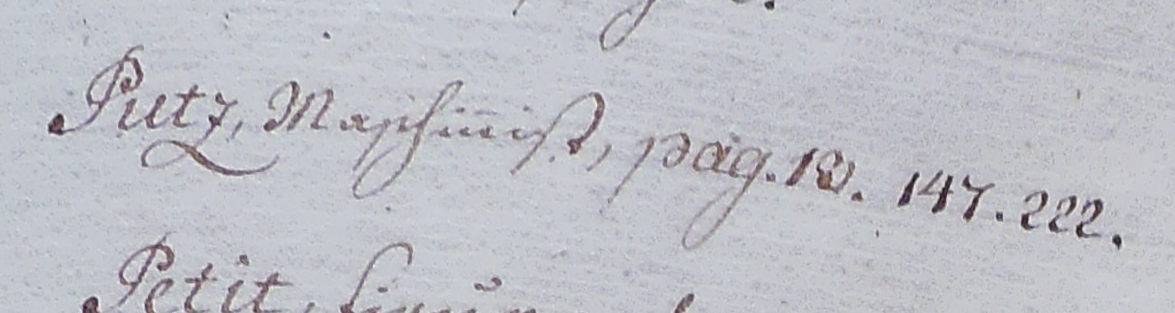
Putz, Maschinist, pag. 13. 147. 222.
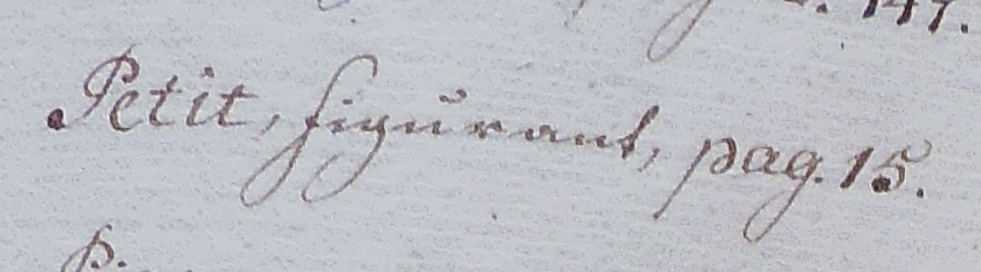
Petit, Figurant, pag. 15.
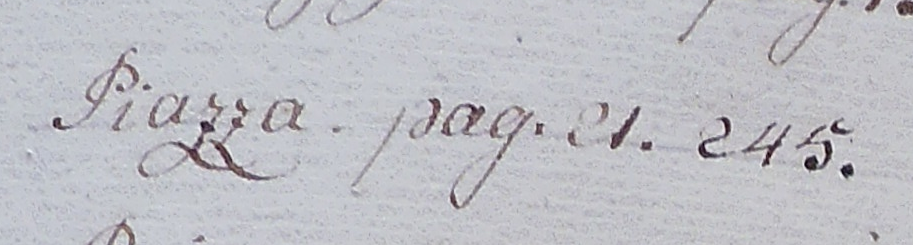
Piazza. pag. 21. 245.
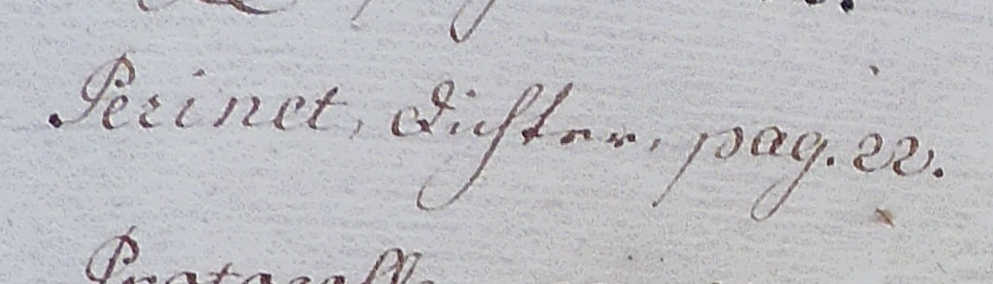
Perinet, Dichter, pag. 22.
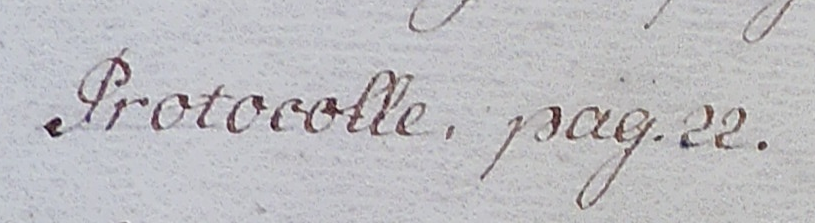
Protocolle, pag. 22.
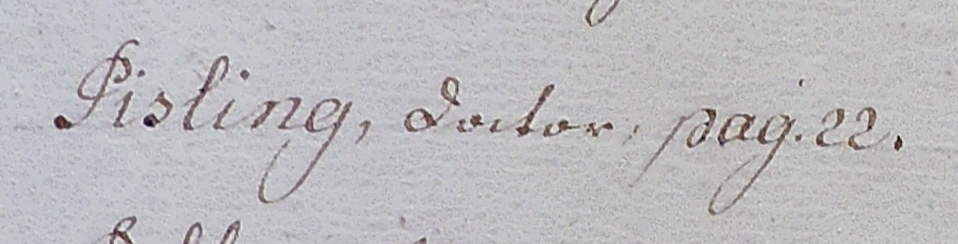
Pisling, Doctor, pag. 22.
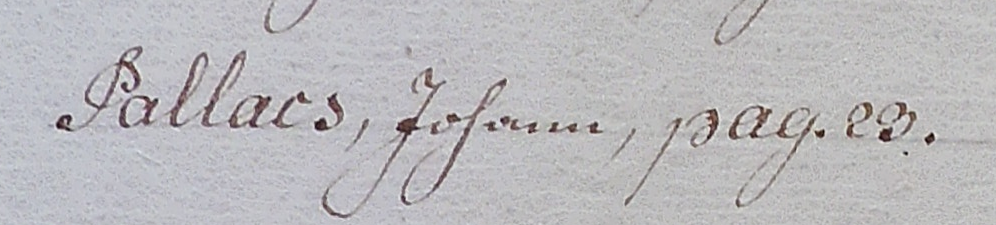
Pallacs, Johann, pag. 23..
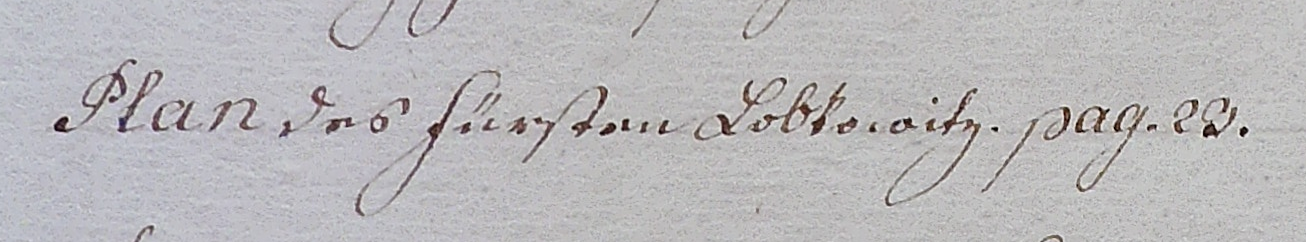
Plan des Fürsten Lobkowitz. pag. 23.
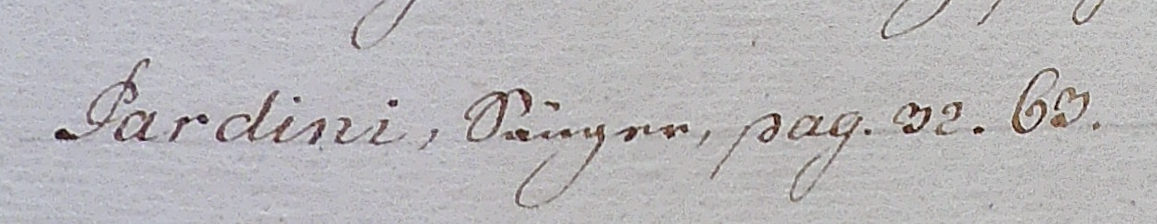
Pardini, Sänger, pag. 32. 63.
